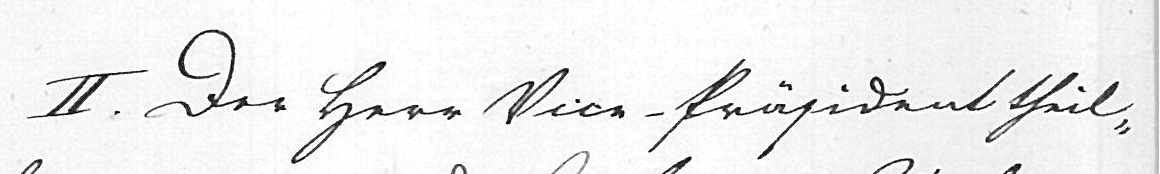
II. Der Herr Vice-Präsident theil-
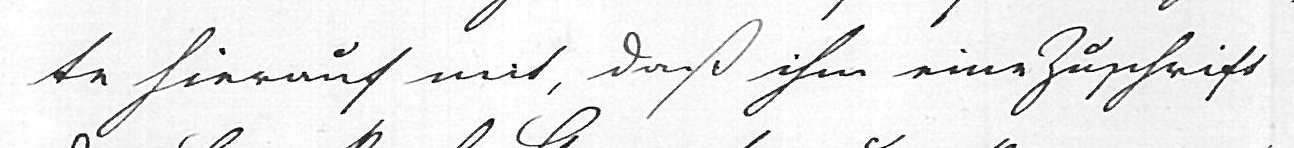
te hierauf mit, daß ihm eine Zuschrift
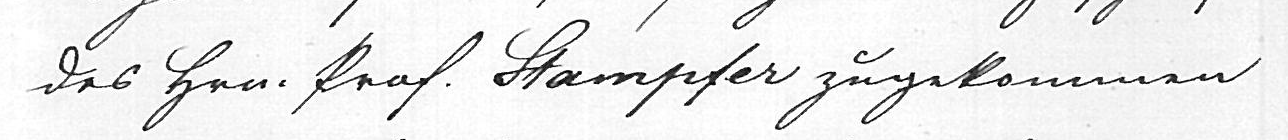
des Hrn. Prof. Stampfer zugekommen
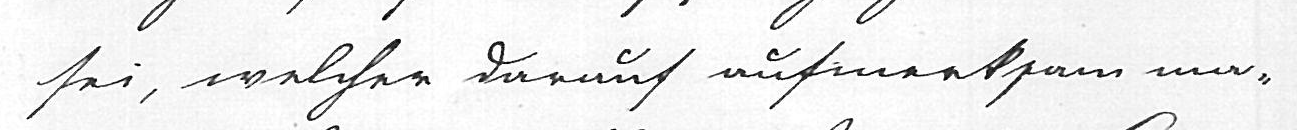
sei, welcher darauf aufmerksam ma-
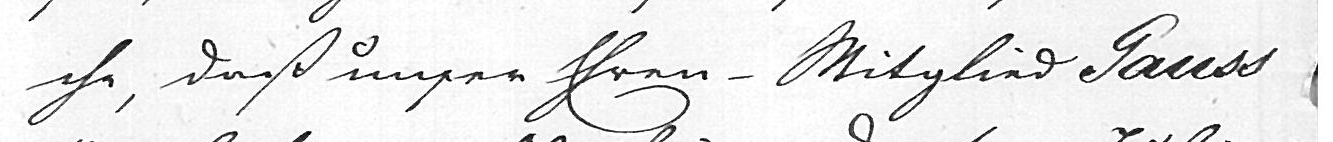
che daß unser Ehren-Mitglied Gauss
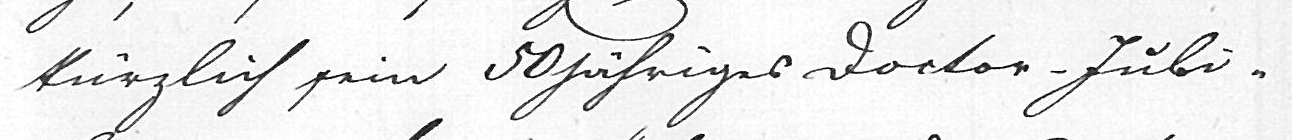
kürzlich sein 50jähriges Doctor-Jubi-
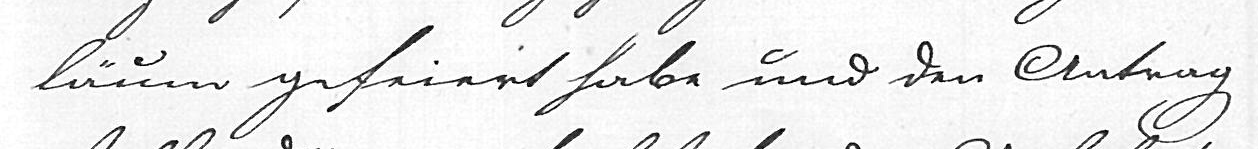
läum gefeiert habe und den Antrag
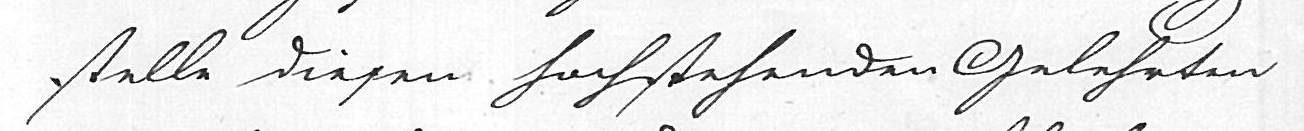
stelle diesen hochstehenden Gelehrten
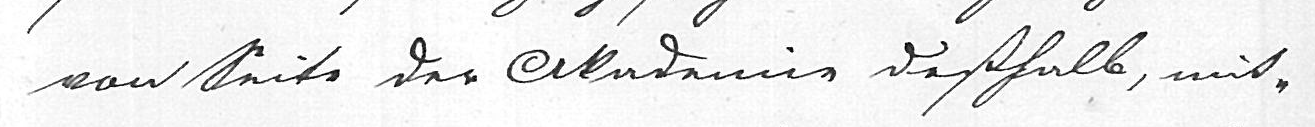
von Seite der Akademie deßhalb, mit-
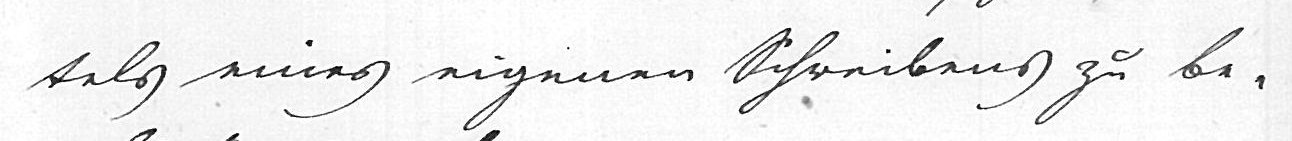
tels eines eigenen Schreibens zu bei-
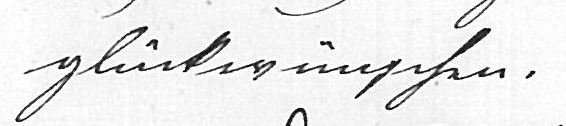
glückwünschen.
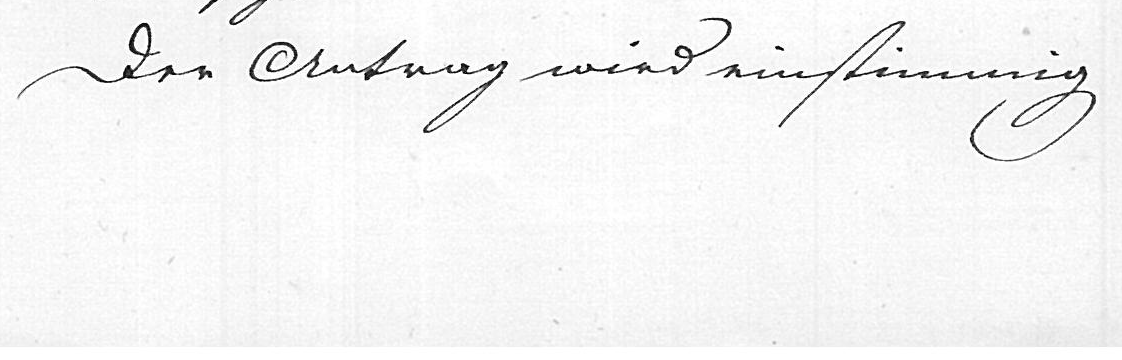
Der Antrag wird einstimmig
